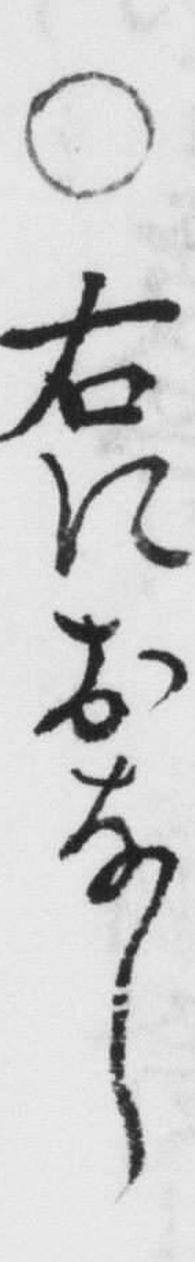○右におなし
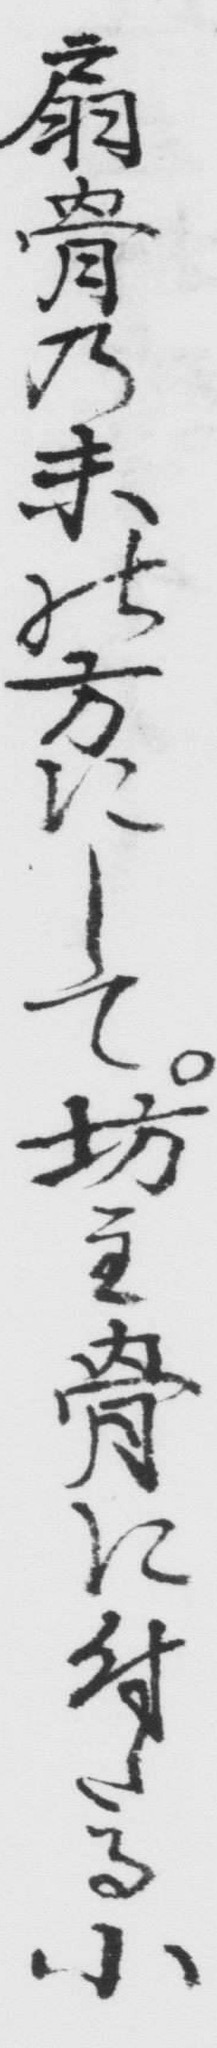要骨扇骨の末の方にして。坊主骨に付たる小
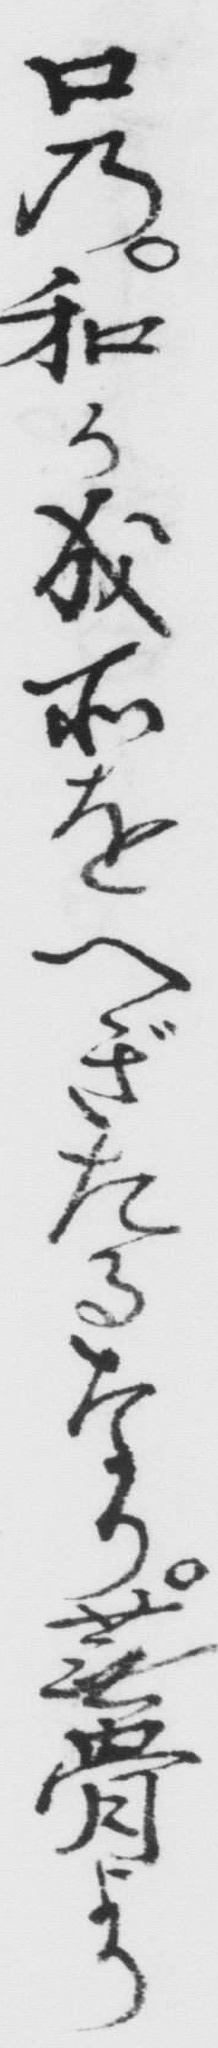口の。和か成所をへぎたるなり。蕪骨より

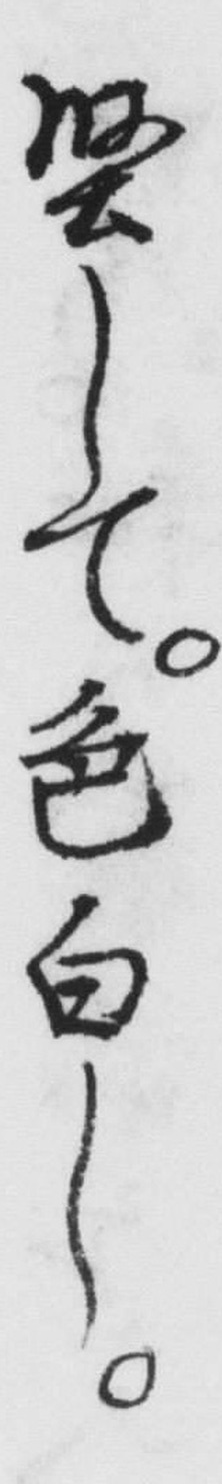堅して。色白し。
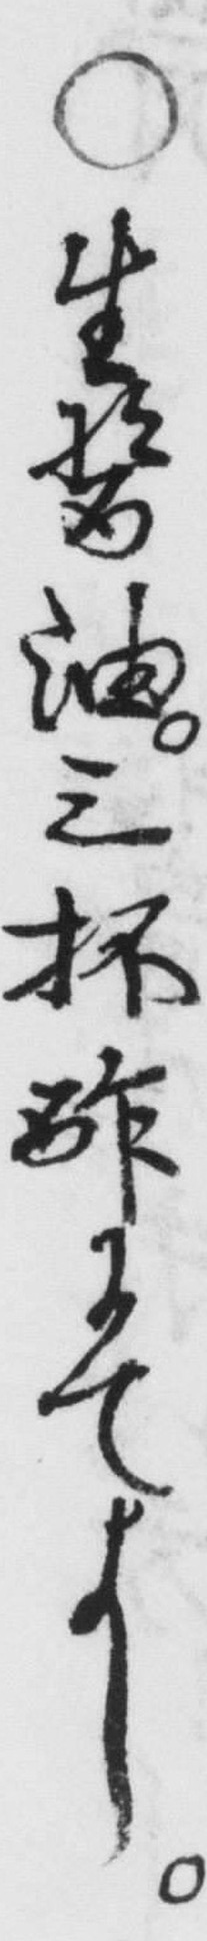○生醤油。三杯酢にてよし。
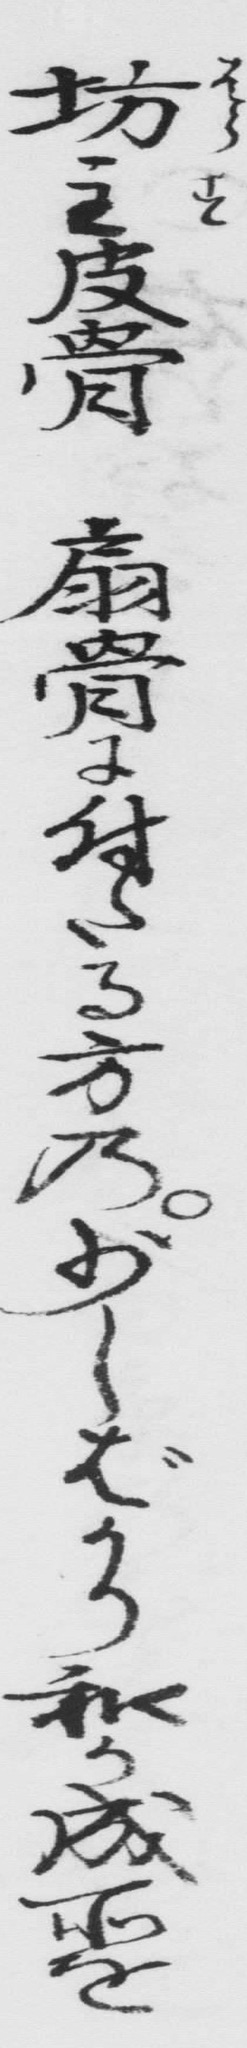坊主皮骨扇骨に付たる方の。少しばかり和か成所を
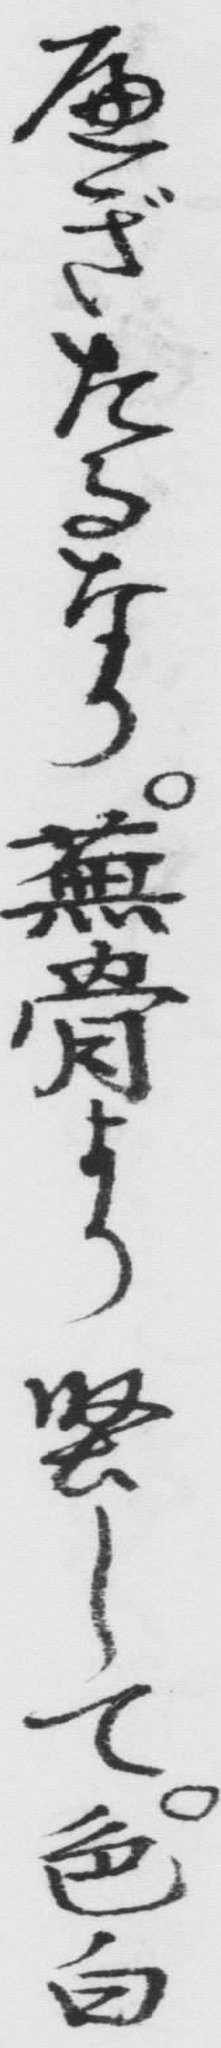へぎたるなり。蕪骨より堅して。色白
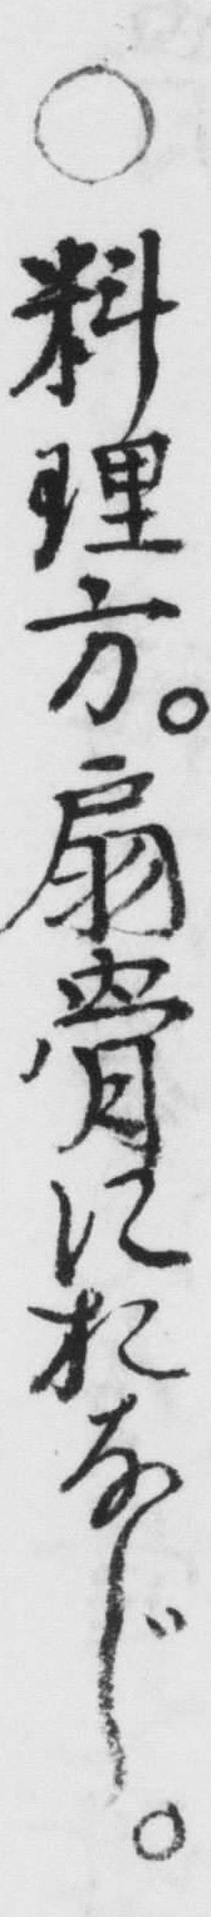○料理方。扇骨におなじ。
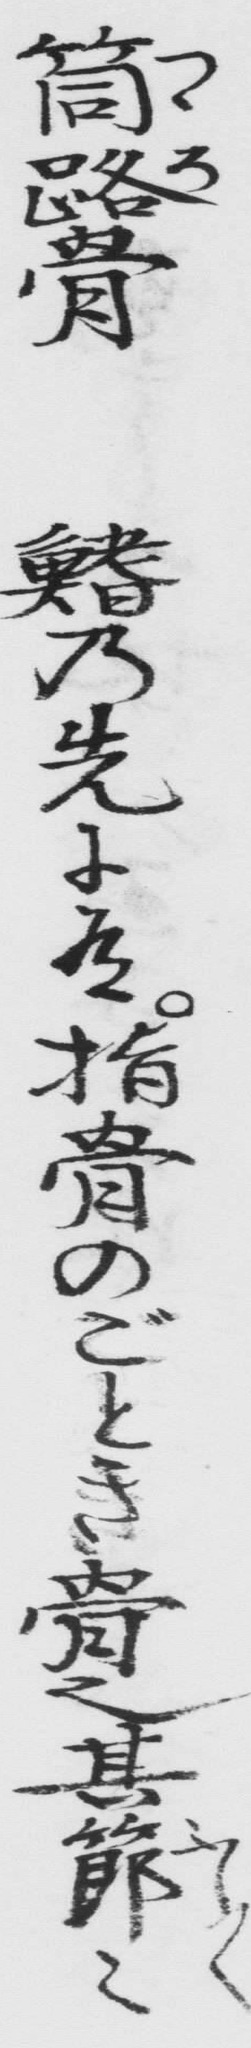筒路骨鰭の先に有。指骨のごとき骨の其節節
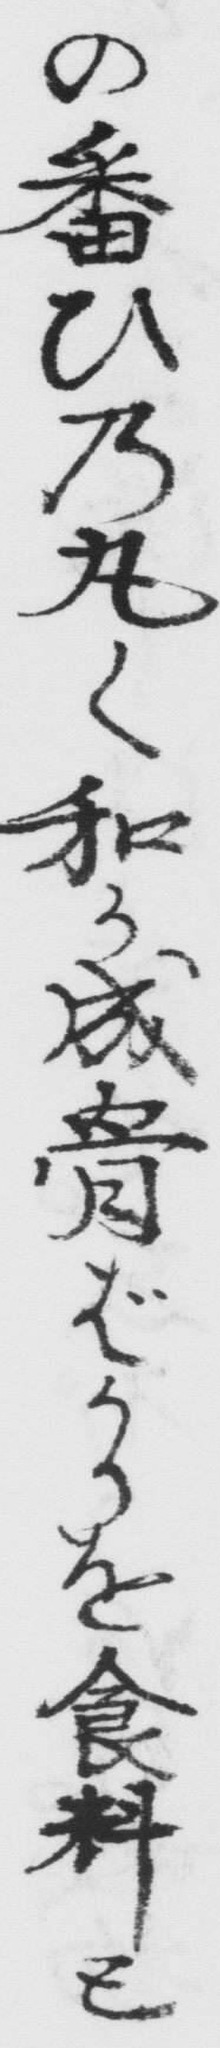の番ひの丸く和か成骨ばかりを食料と
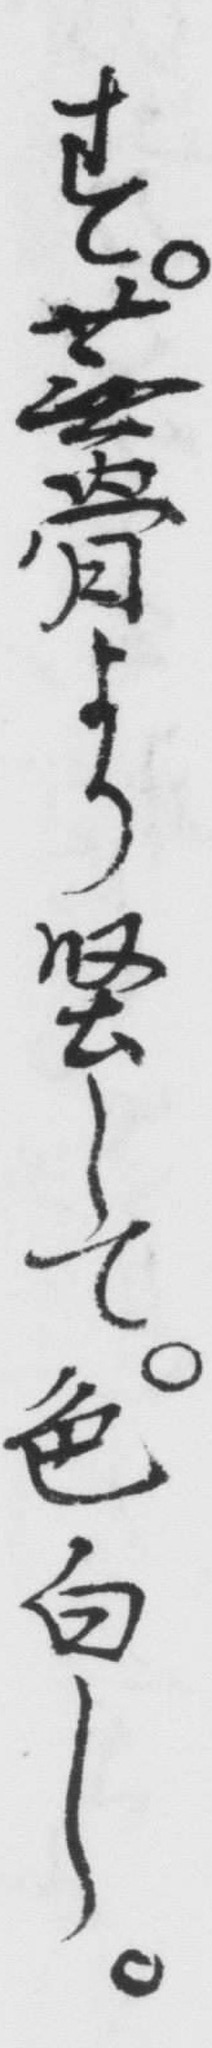す。蕪骨より堅して。色白し。
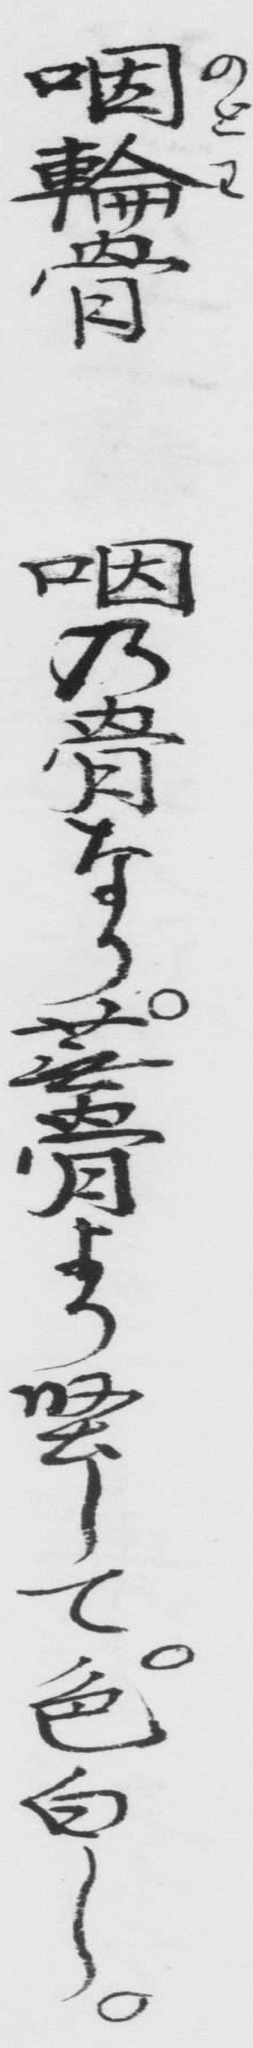咽輪骨咽の骨なり。蕪骨より堅して。色白し。
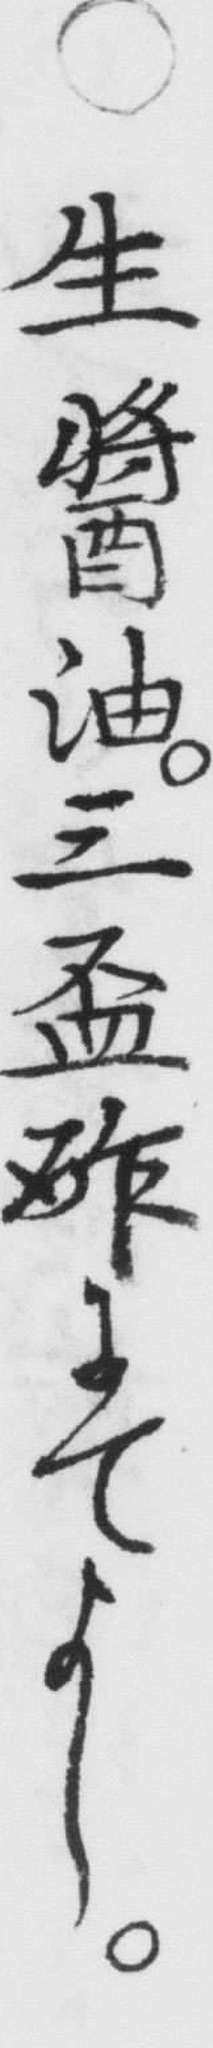○生醤油。三杯酢にてよし。
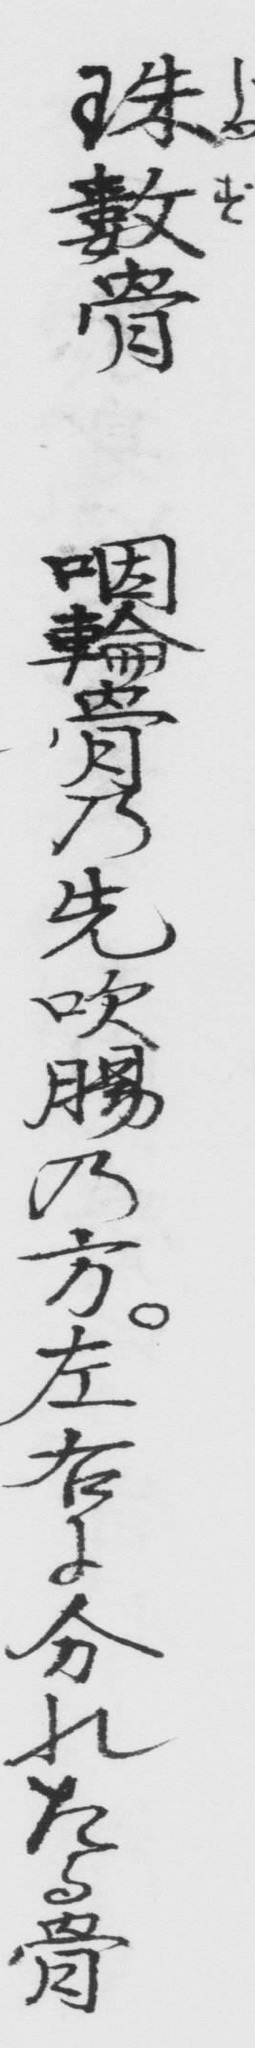珠数骨咽輪骨の先吹腸の方。左右に分れたる骨
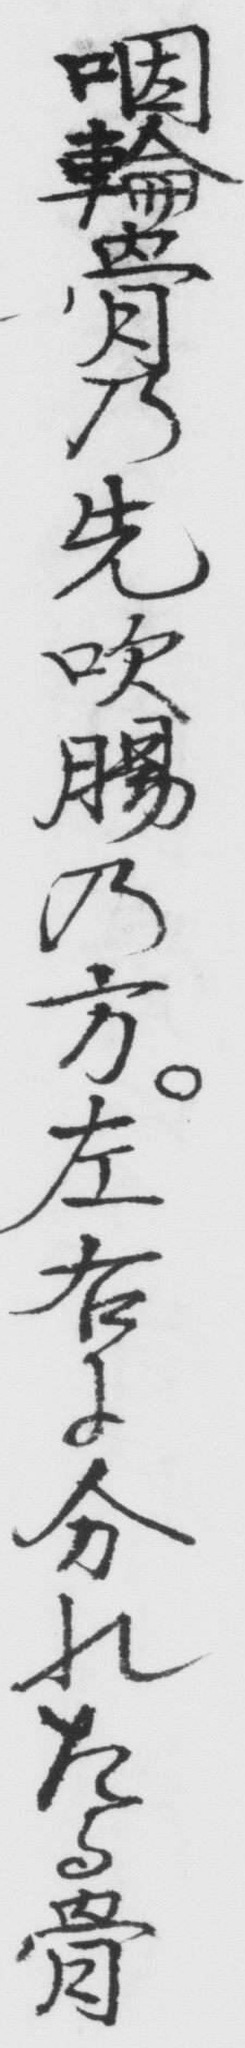珠数骨咽輪骨の先吹腸の方。左右に分れたる骨
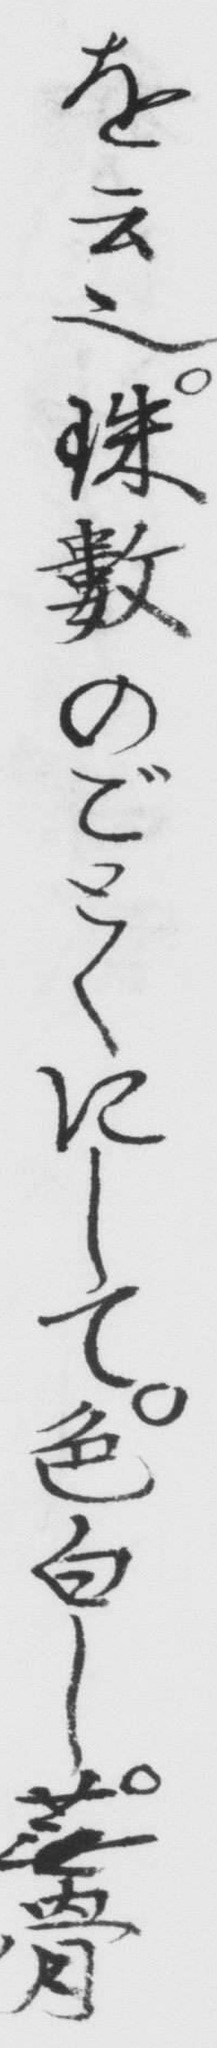を云也。珠数のごとくにして。色白し。蕪骨
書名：鯨肉調味方
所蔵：大阪府立大学学術情報センター 国文学研究資料館
